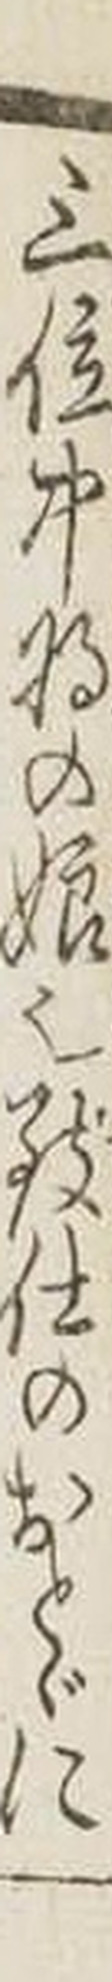三位中将の娘也致仕のおとゞに
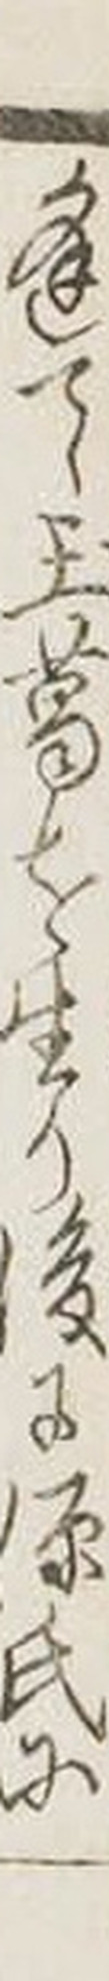逢て玉葛を生り後に源氏に
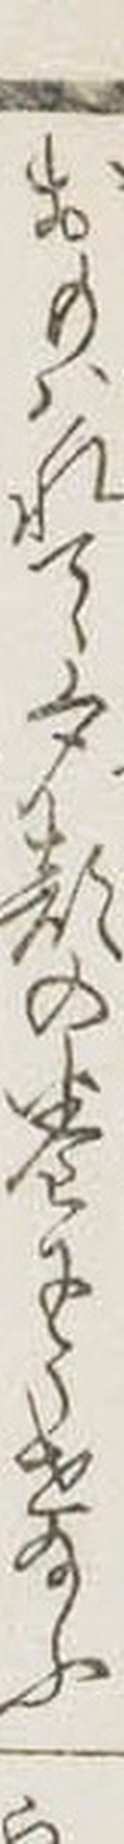おもはれて夕顔の巻にうせ給ふ
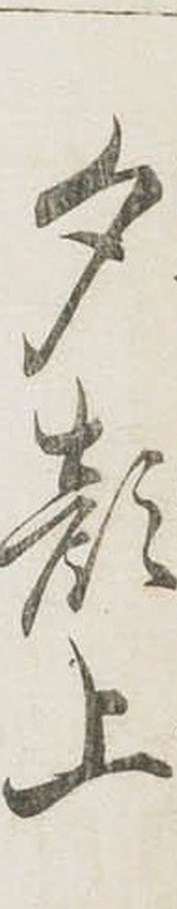夕顔上
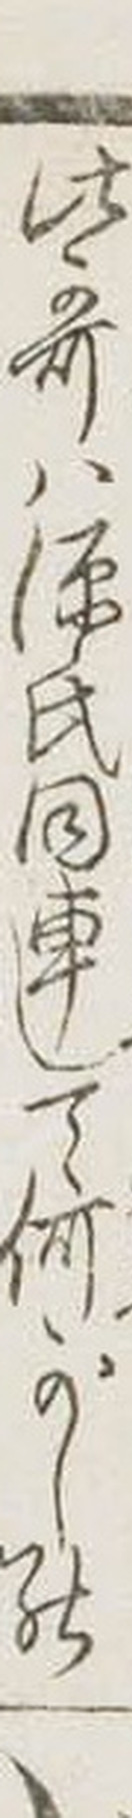此哥は源氏同車して何がしの
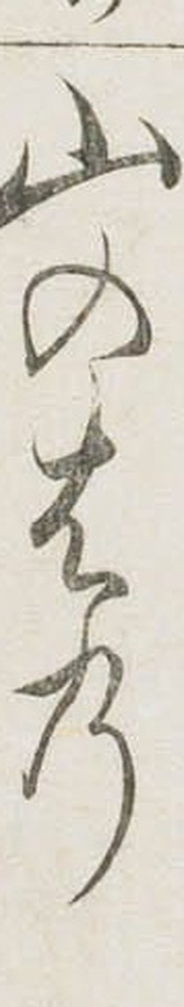山のはの
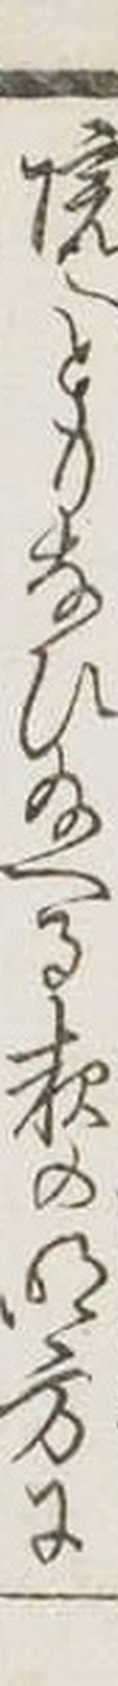院へともなひ給へる夜の明方に
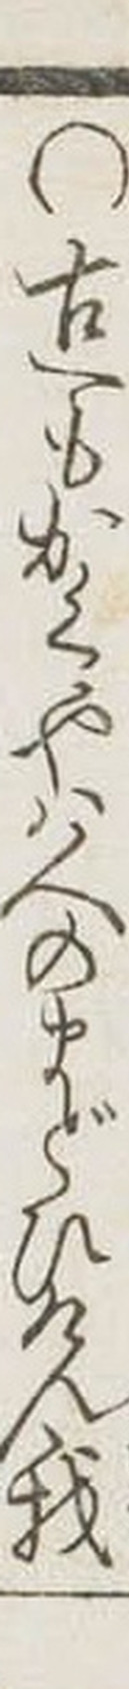○古へもかくやは人のまどひけん我
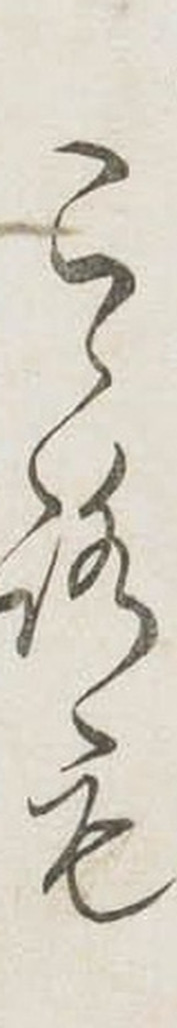こゝろも
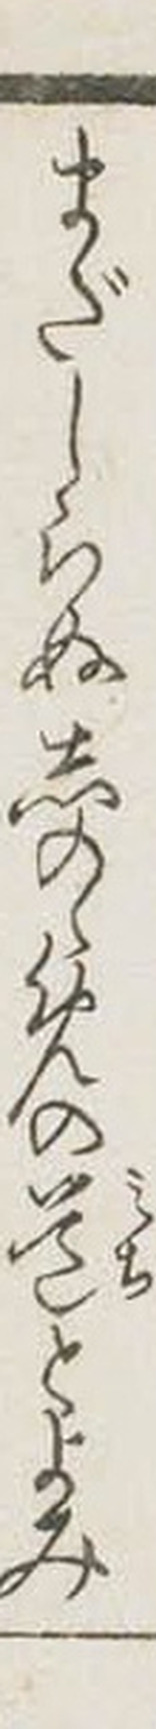まだしらぬしのゝめの道とよみ
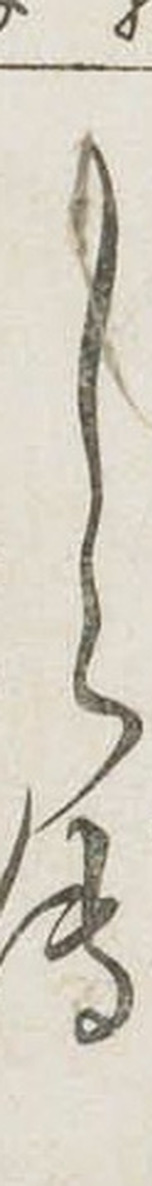しらて
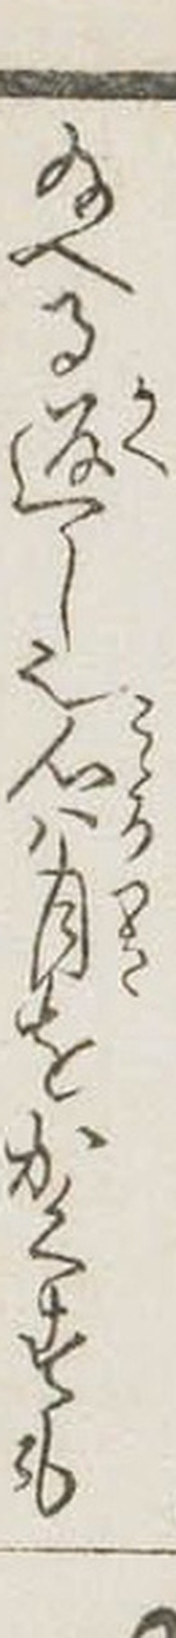給へる返し也心は月をかくすも
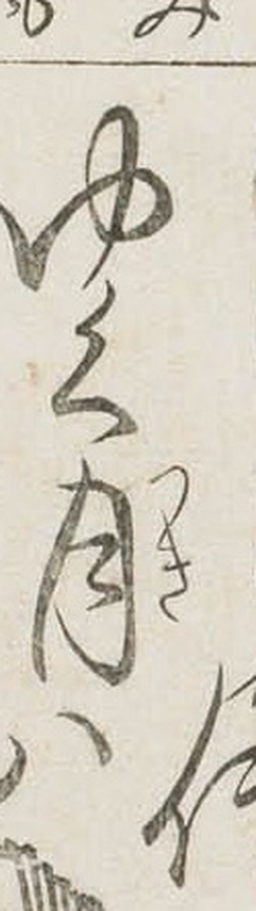ゆく月は
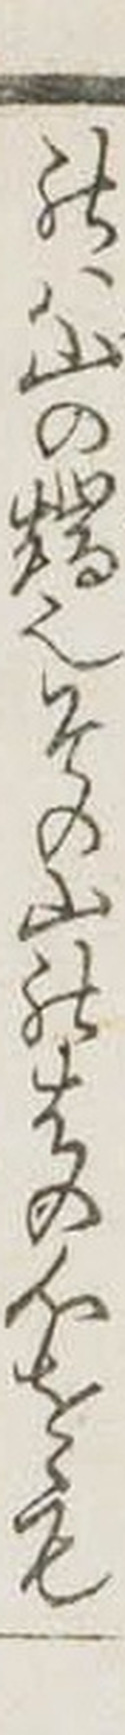のは山の端也その山のはの心をも
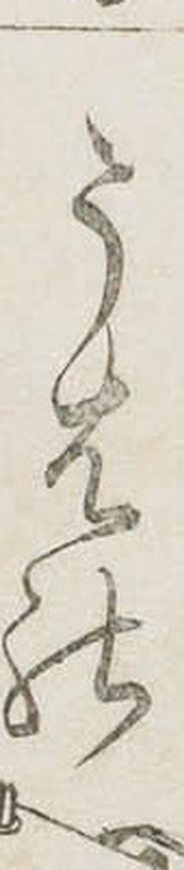うはの
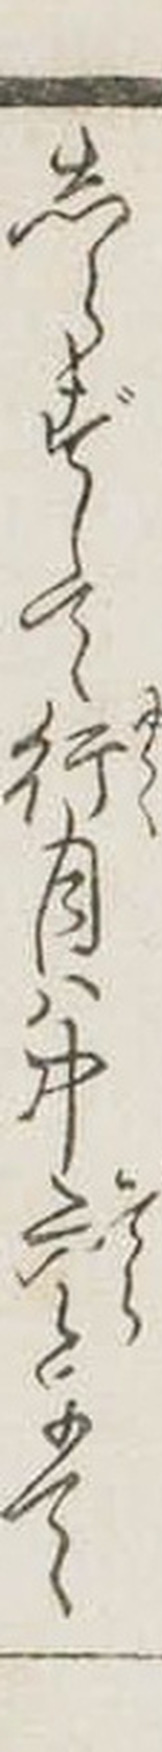しらずして行月は中空にて
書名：源氏百人一首
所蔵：東京学芸大学教育コンテンツアーカイブ
